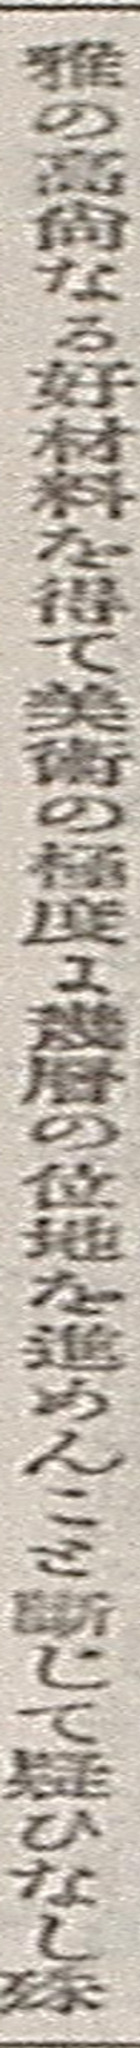雅の高尚なる好材料を得て美術の極度に幾層の位置を進めんこと断じて疑ひなし殊
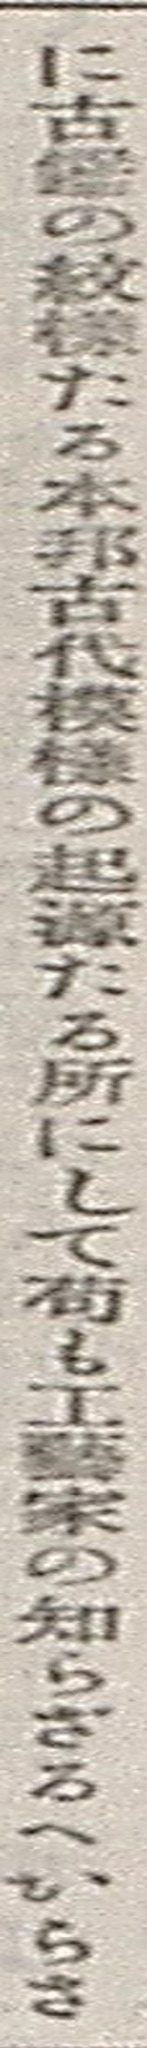に古鑑の紋様たる本邦古代模様の起源たる所にして苟も工芸家の知らざるへからさ
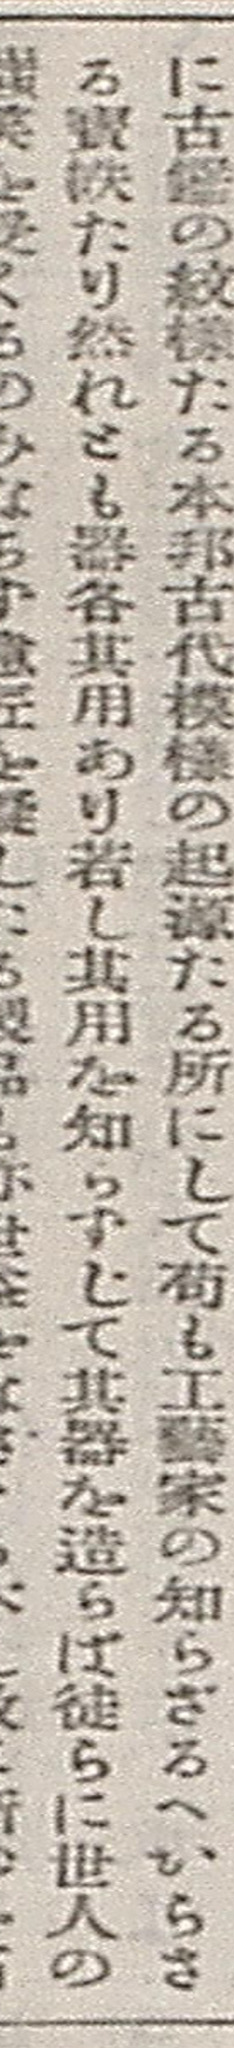る寶鉄たり然れども器各其用あり若し其用を知らずして其器を造らば徒らに世人の
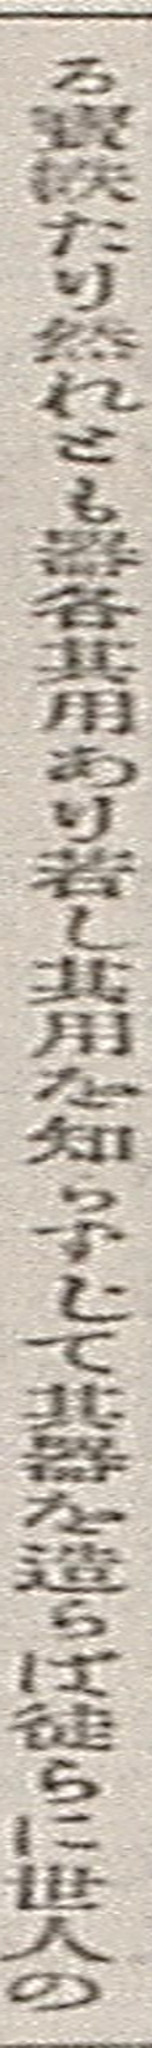る寶鉄たり然れども器各其用あり若し其用を知らずして其器を造らば徒らに世人の
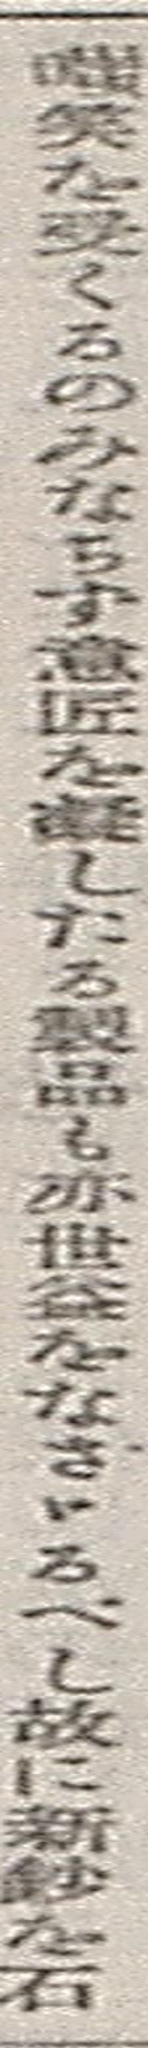哄笑を受くるのみならず意匠を意匠を凝したる製品も亦世益をなさゞるべし故に新鈔石
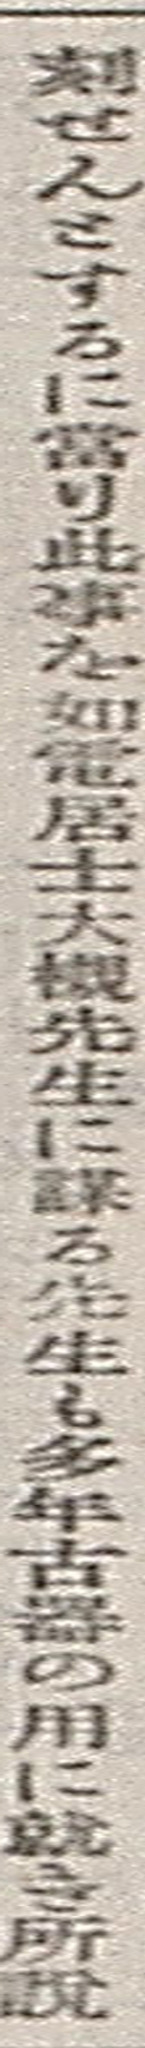刻せんとするに当り此事を如電居士大槻先生に某るせ先生も多年古器の用に就き所説
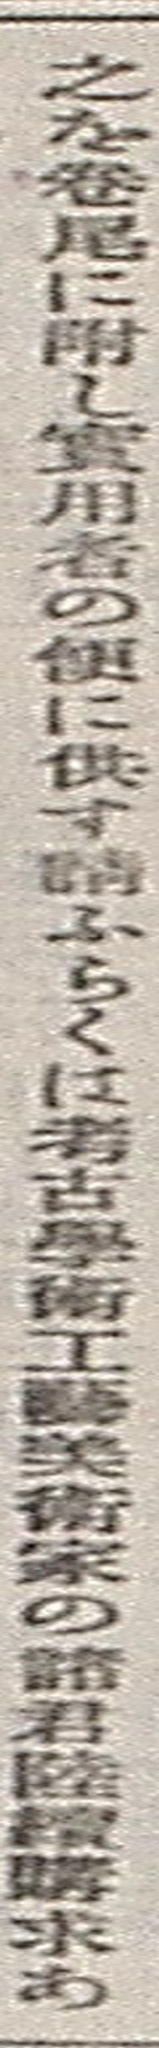之を巻尾に附し実用者の便に供す請ふらくは考古学術工芸美術家の諸君陸続贖求亜あ
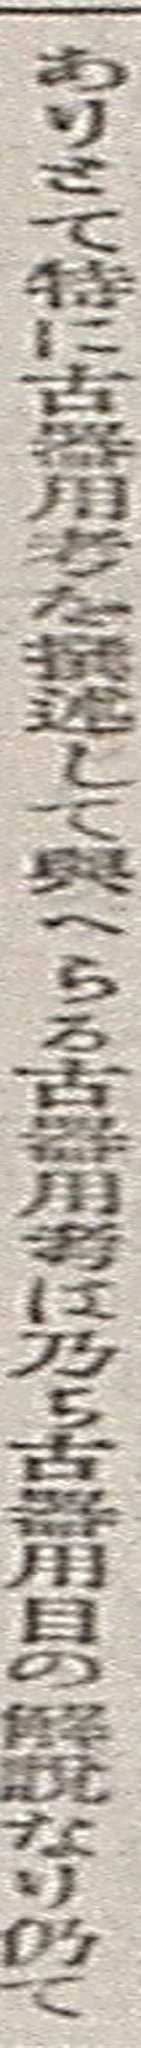ありとて特に古器用考を撰述して輿へらる古器用考は乃ち古器用目の解説なり仍て
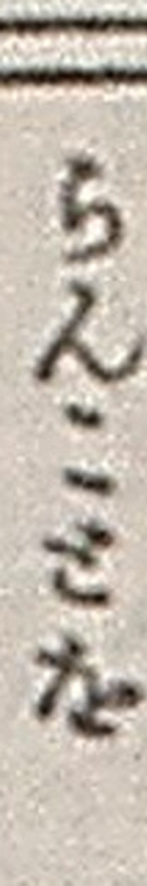らんことを
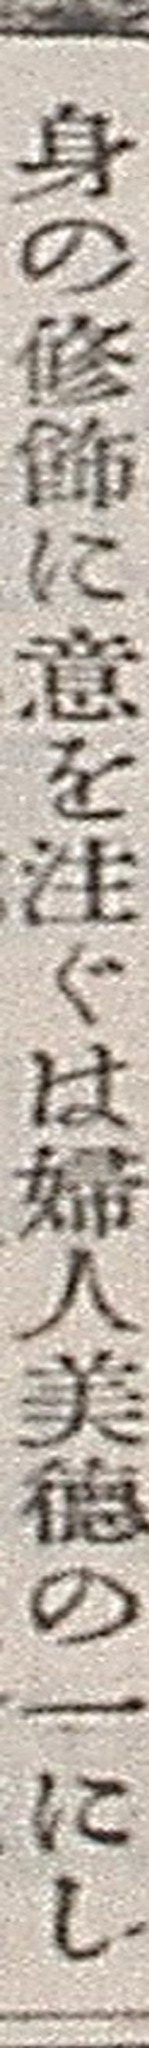身の修飾に意を注ぐは婦人美徳の一にし
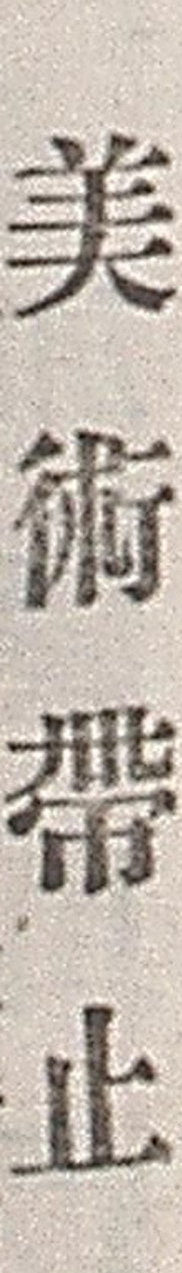美術帯止
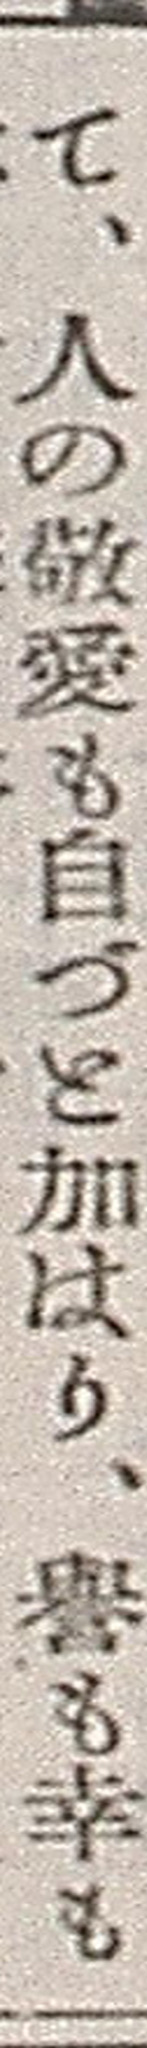て、人の敬愛も自づと加はり、誉も幸も
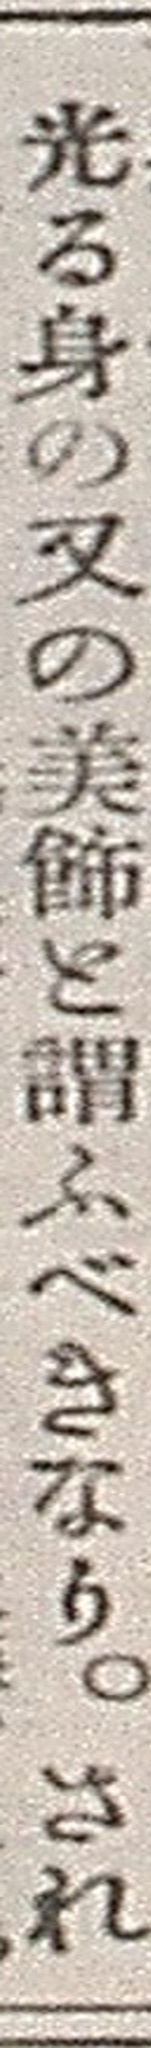光る身の又の美飾と謂ふべきなり。され
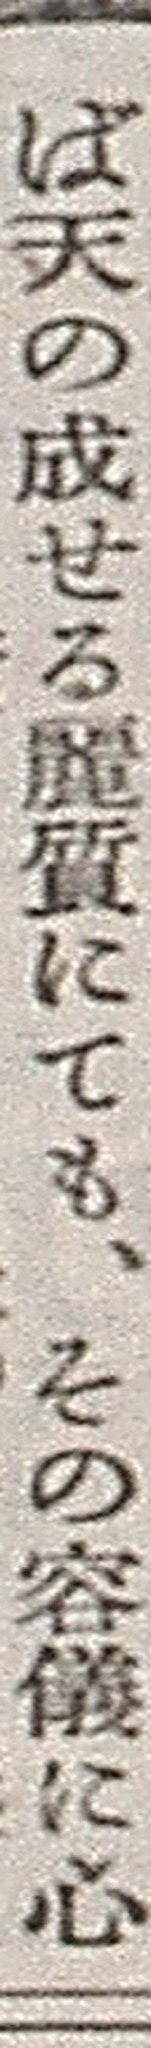ば天の成せる例質にても、その容儀に心
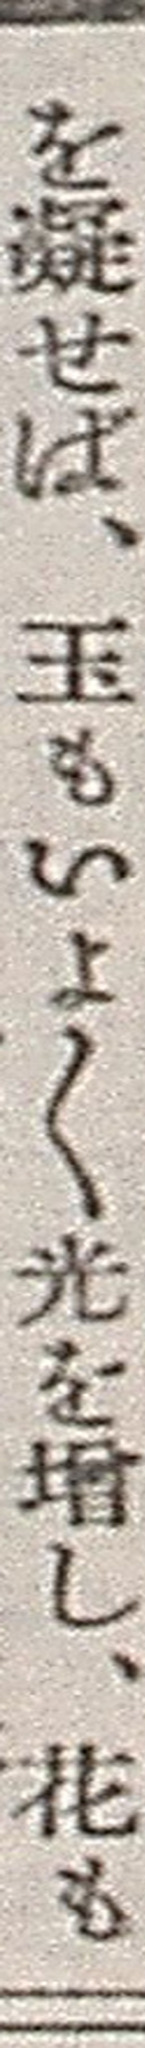を凝せば、玉もいよ〳〵光を増し、花も
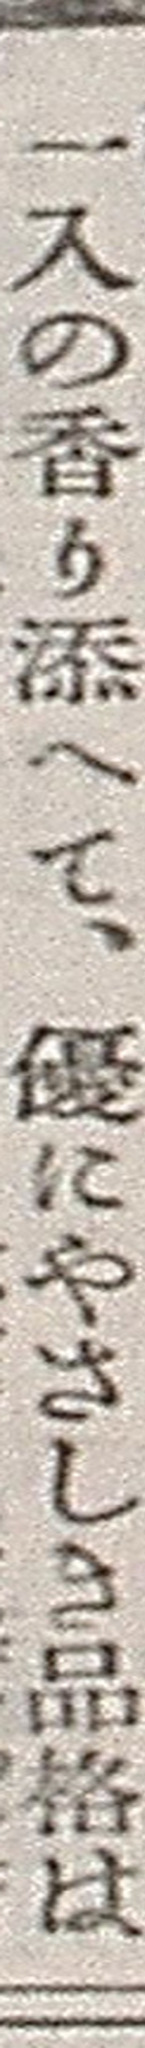一入の香り添へて、優にやさしき品格は
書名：風俗畫報臨時増刊第百二十六號　洪水被害録（中）
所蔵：東京大学地震研究所図書室 Earthquake Research Institute Library, The University of Tokyo, JAPAN
